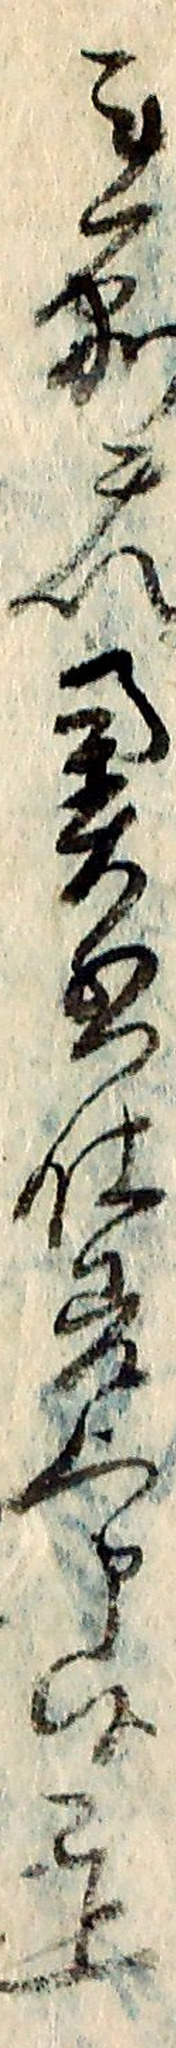連判を以奥書仕差上申候已上
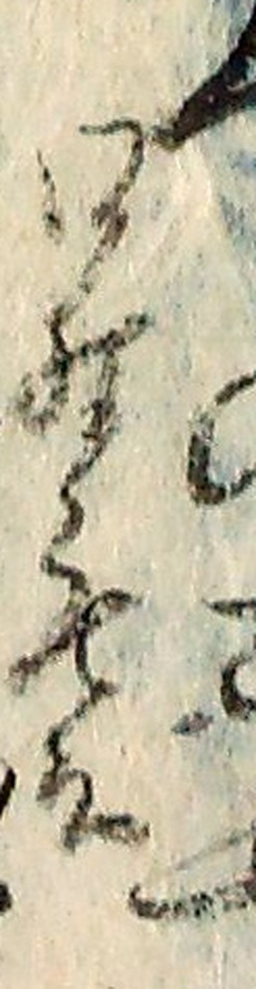同村庄屋
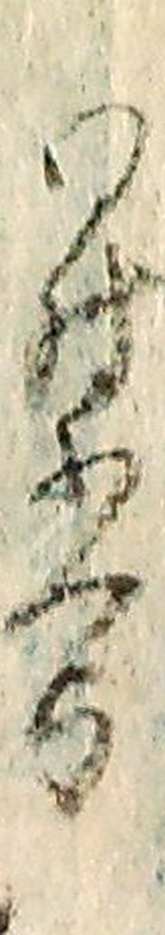同村五人与
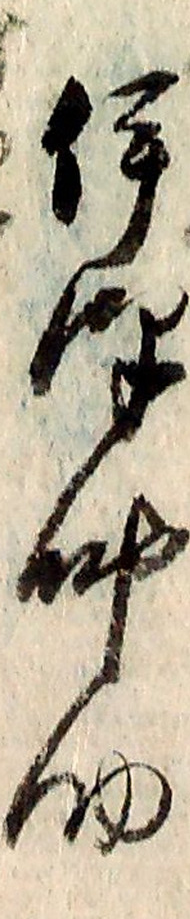伊沢仲助
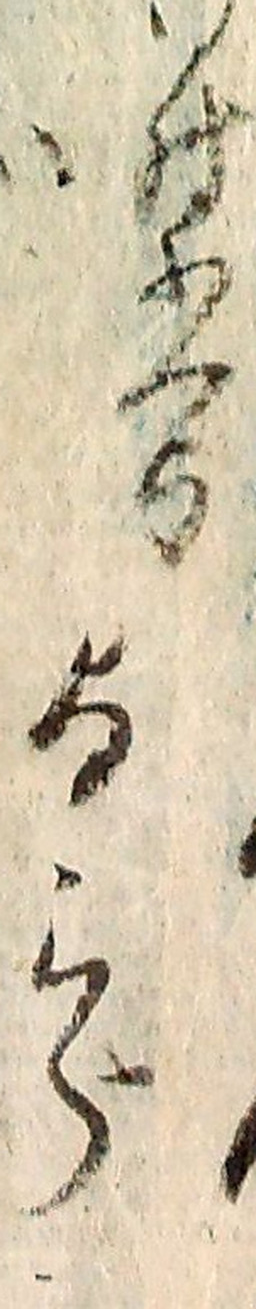与三郎
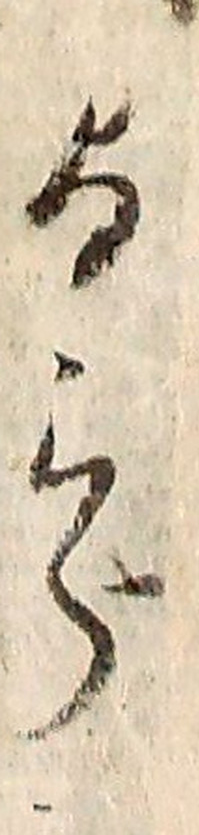与三郎
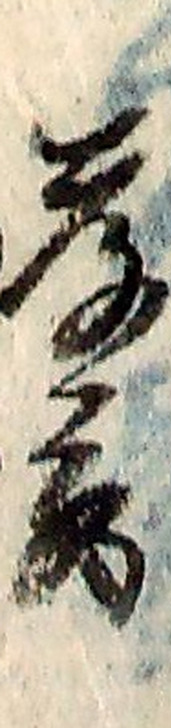利兵衛

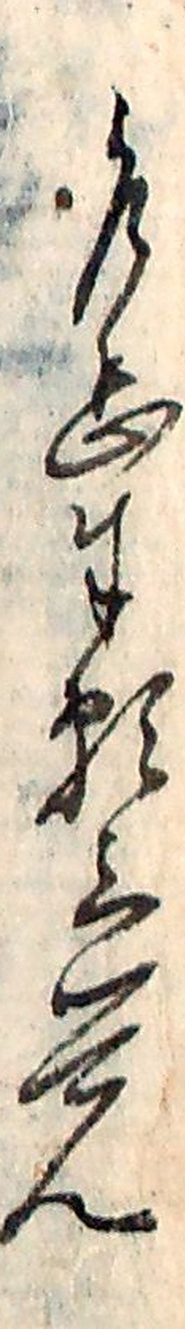乍恐奉願上覚
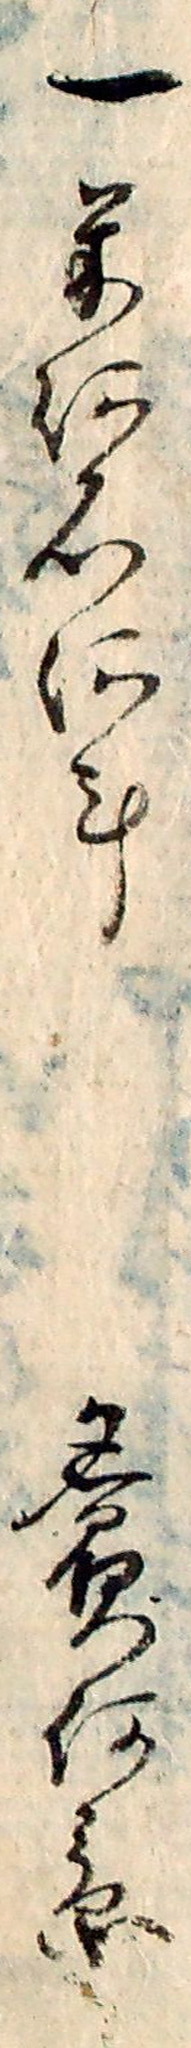一米何石何斗名負何兵衛
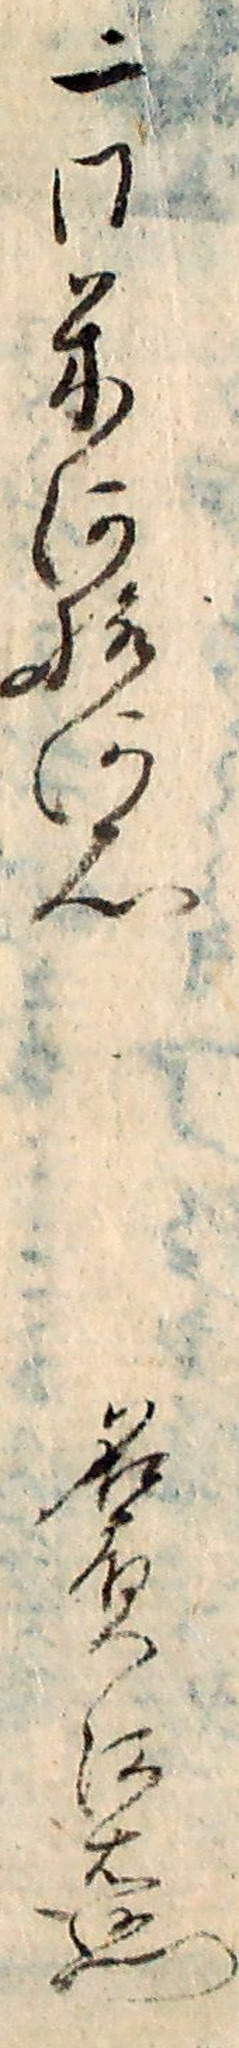一同米何拾何石名負何右衛門
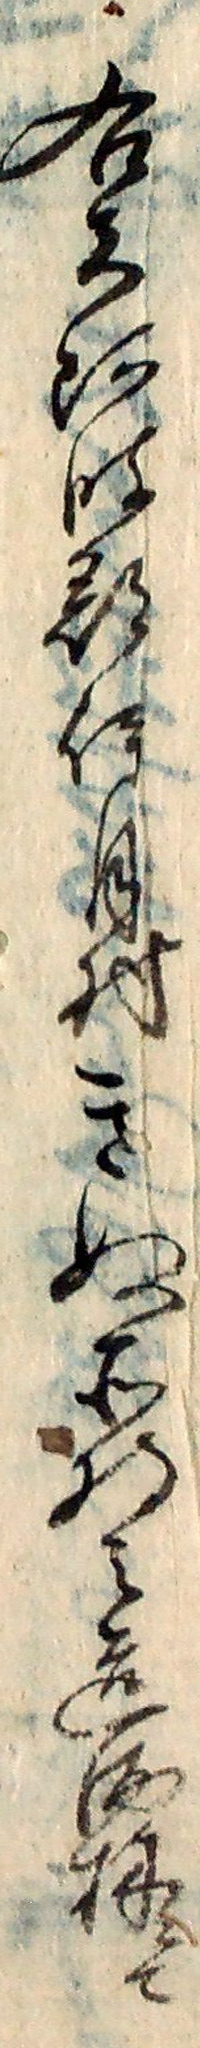右は阿波郡伊月村きぬ所持之造酒株にて
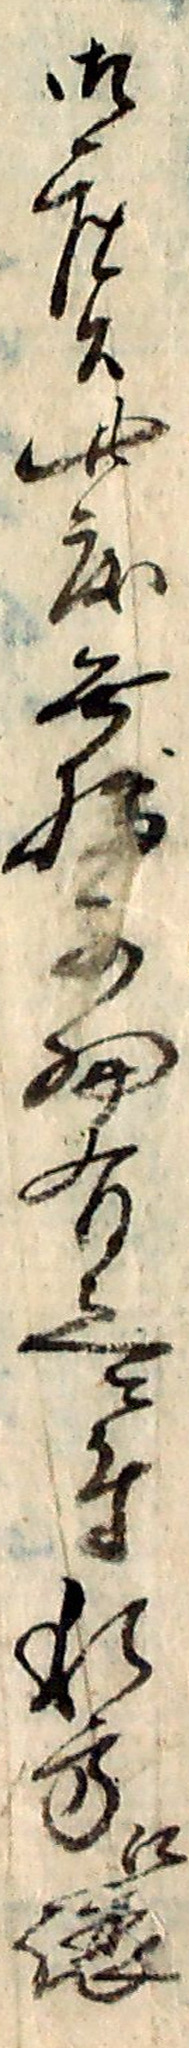御座候此度無拠子細有之に付私方え譲
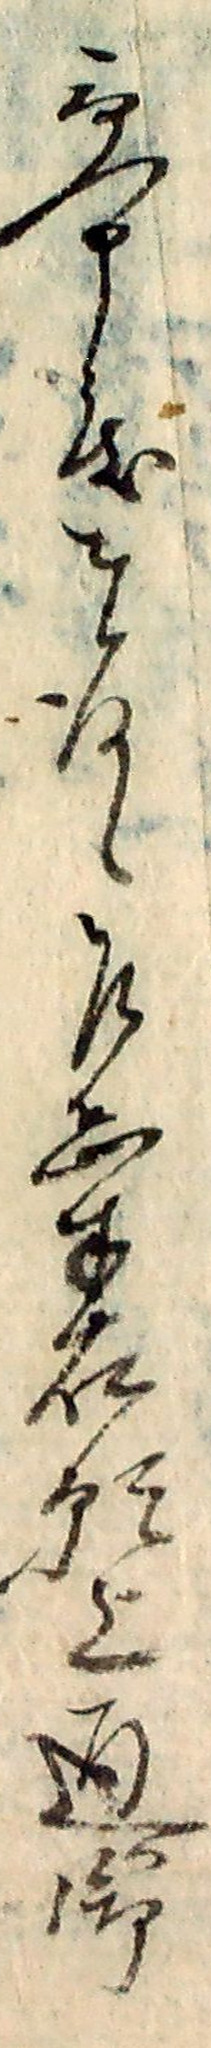受申度奉存候乍恐奉右願上通り御
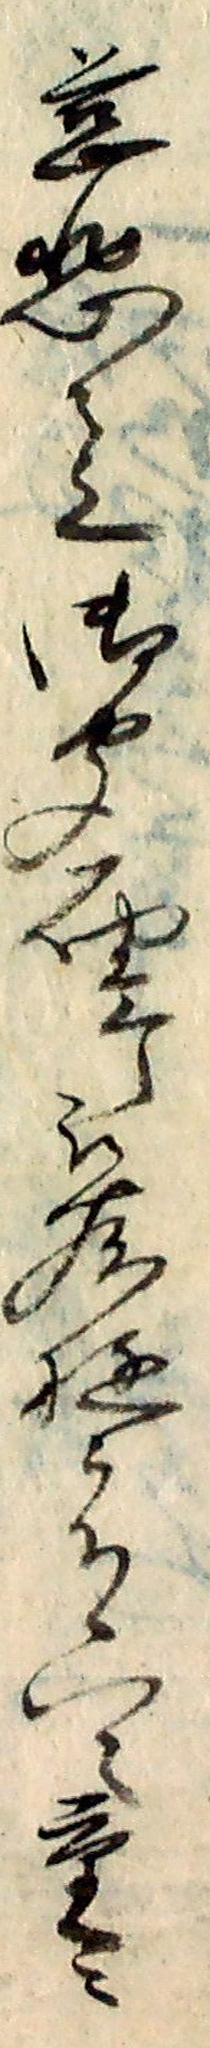慈悲之上御聞届け被為遊被下候はゝ重々
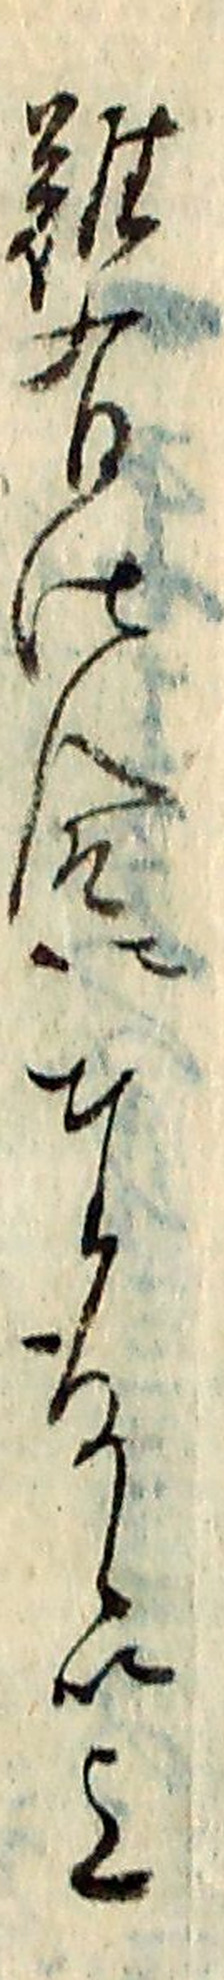難有仕合に奉存候以上
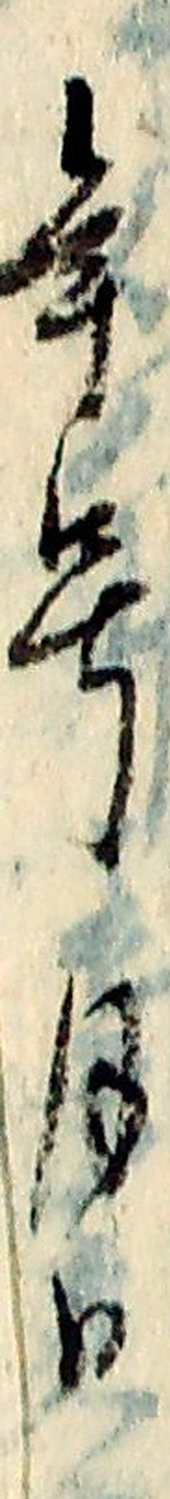年号月日
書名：諸御願書控(後藤氏壱番）
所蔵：鳴門教育大学 Naruto University of Education
